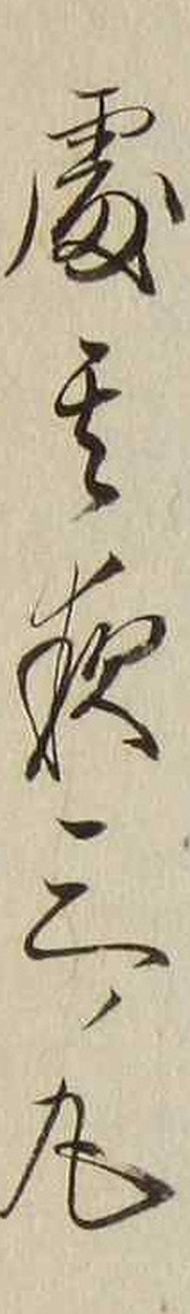処其夜三ノ丸
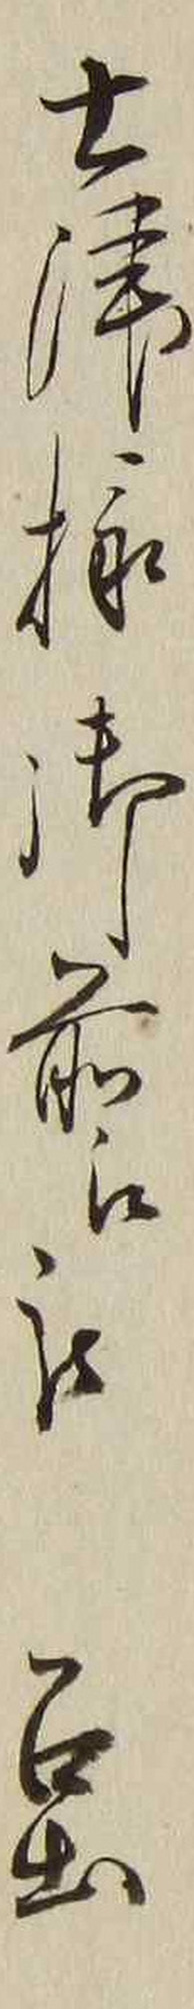士津様御前江被召出
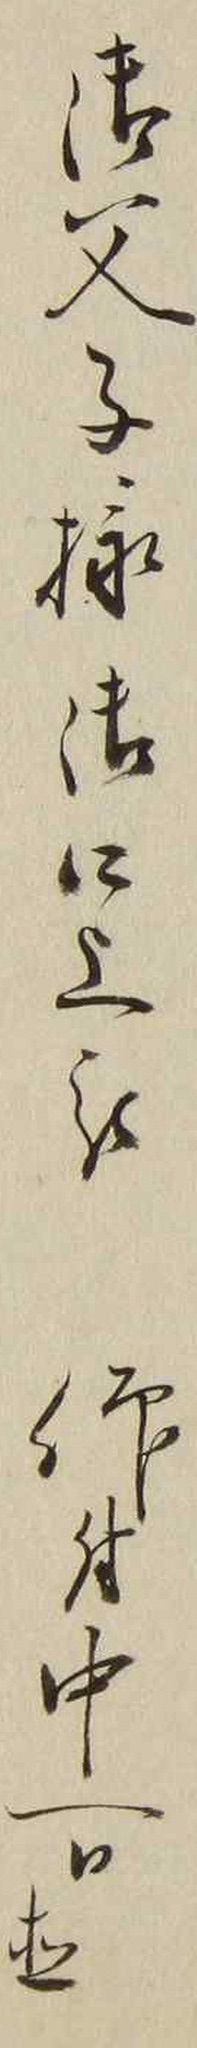御父子様御口上被仰付中一口直

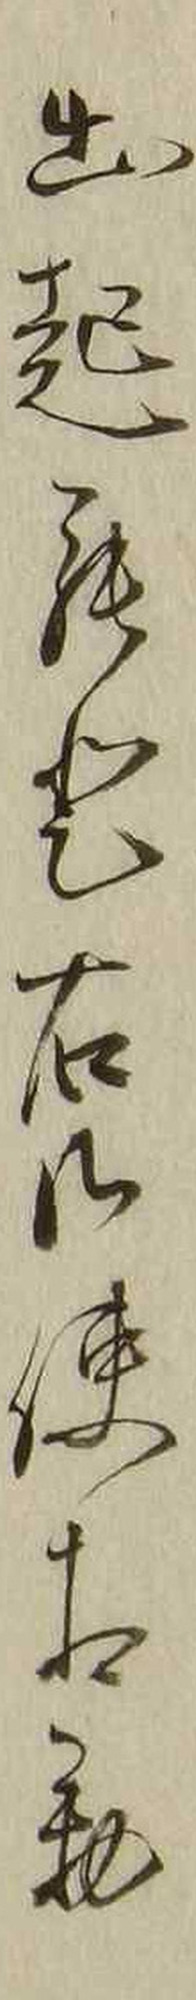出起罷登右御使相勤
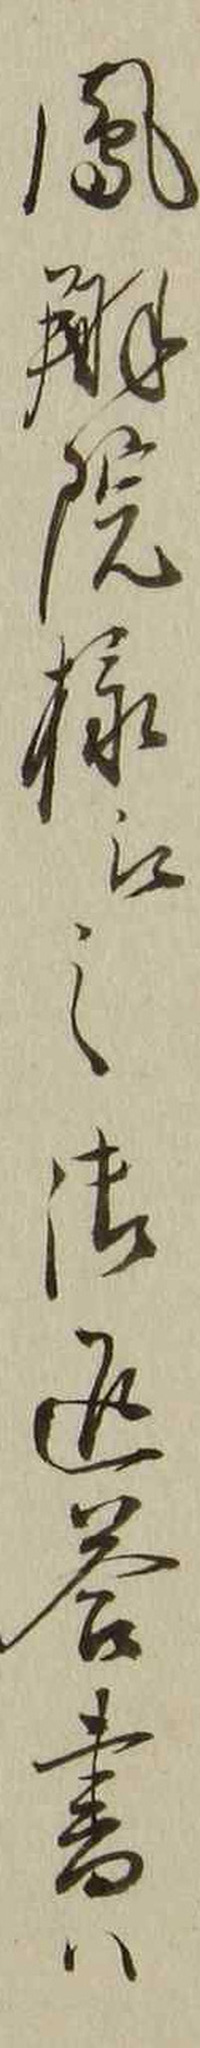鳳翔院様江之御返答書は
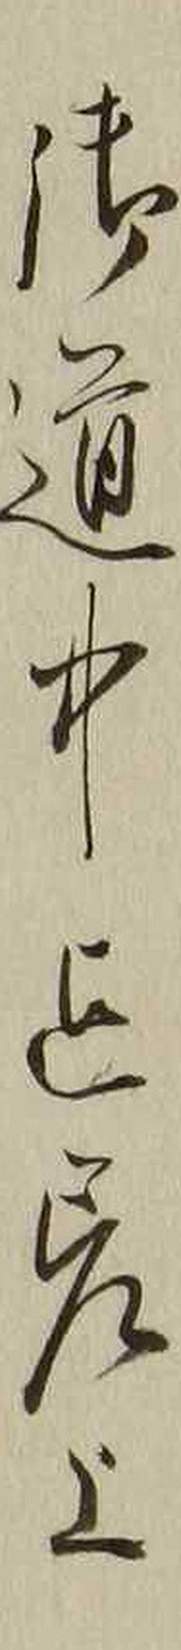御道中迄差上
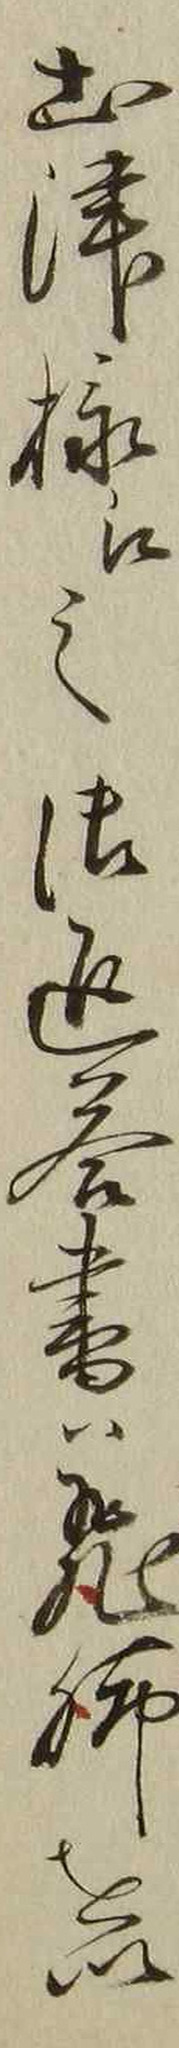土津様衛之御返答書は飛脚を以
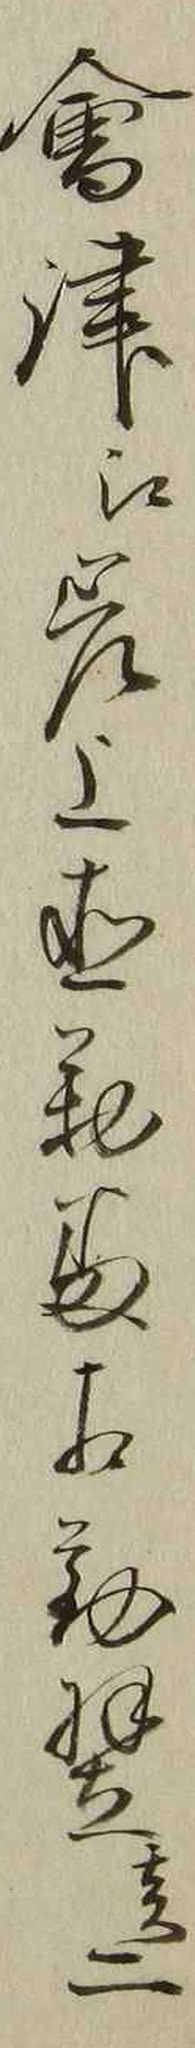会津江差上直勤番相勤翌亥二
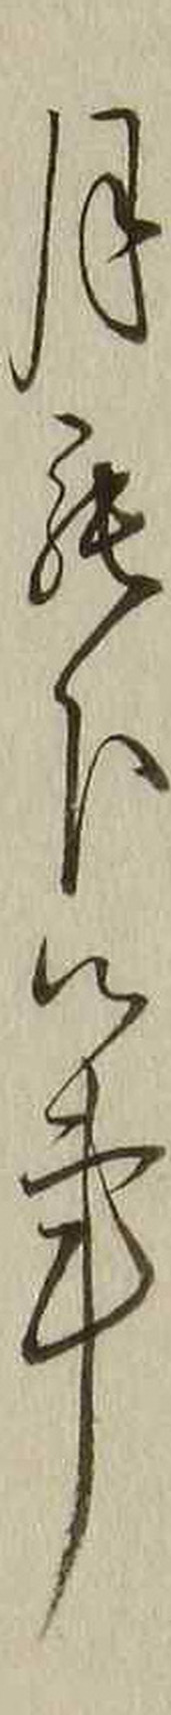月罷下候事
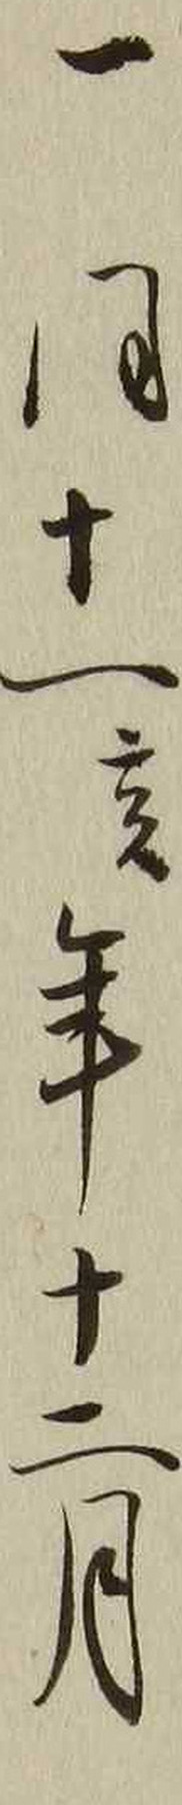一同十一亥年十二月
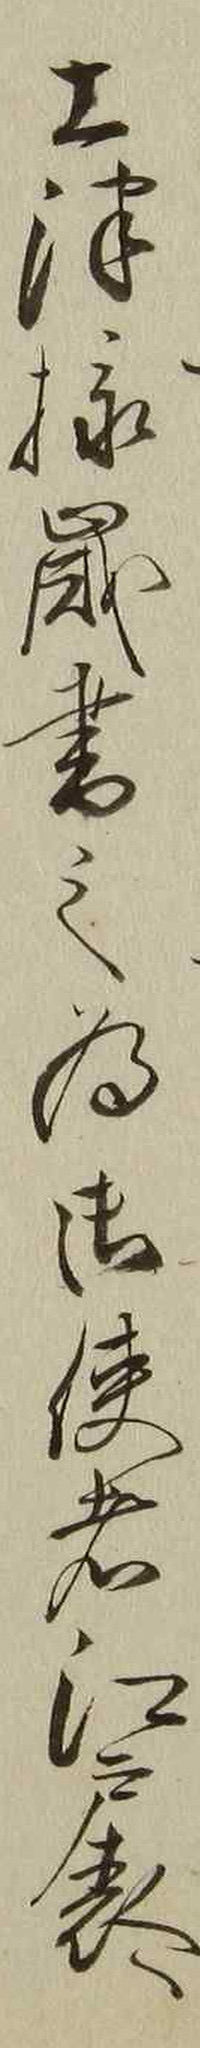土津様歳書之為御使者江戸表へ
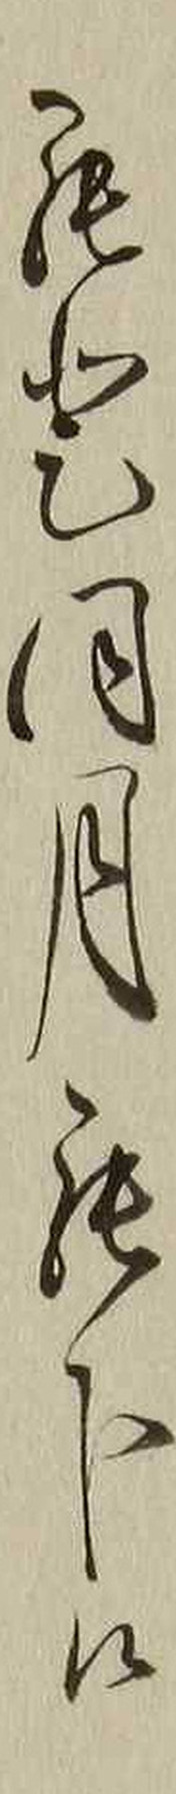罷登同月罷下候
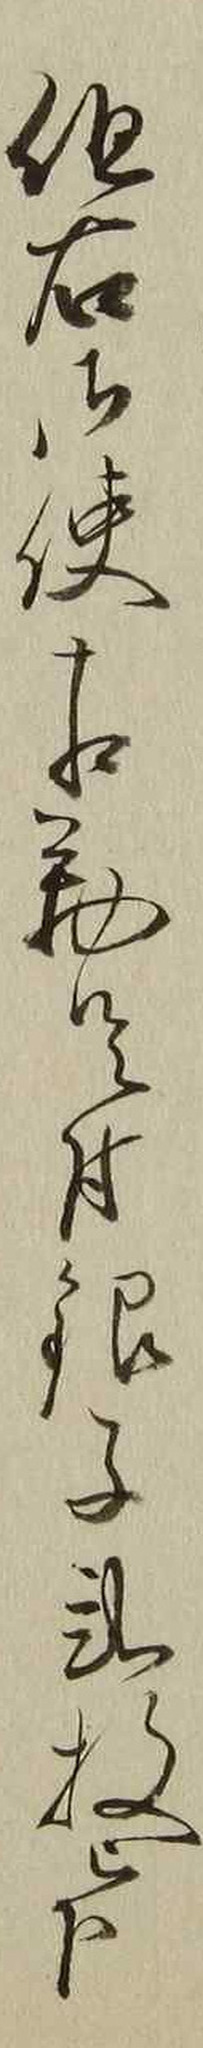但右御使勤候に付銀子弐枚被下
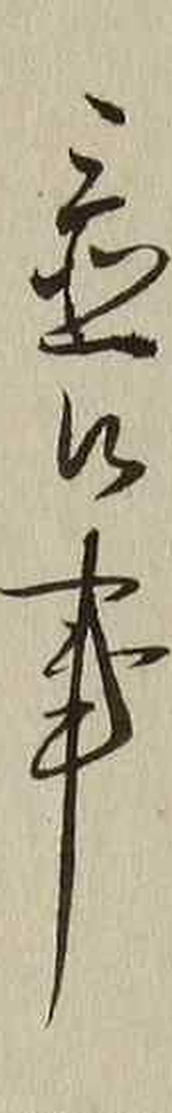置候事
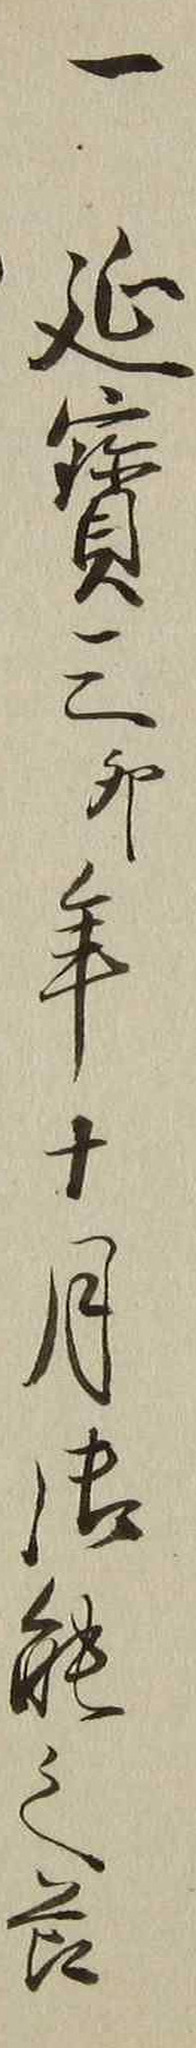一延宝三卯年十月御能之節
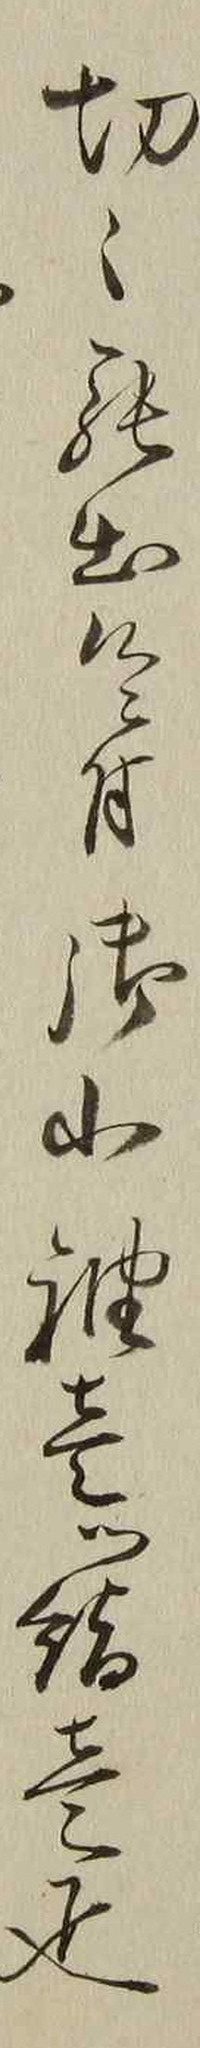切々罷出候に付御小袖壱つ絹壱疋
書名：諸士系譜　巻之103　か之部11
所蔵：会津若松市立会津図書館
